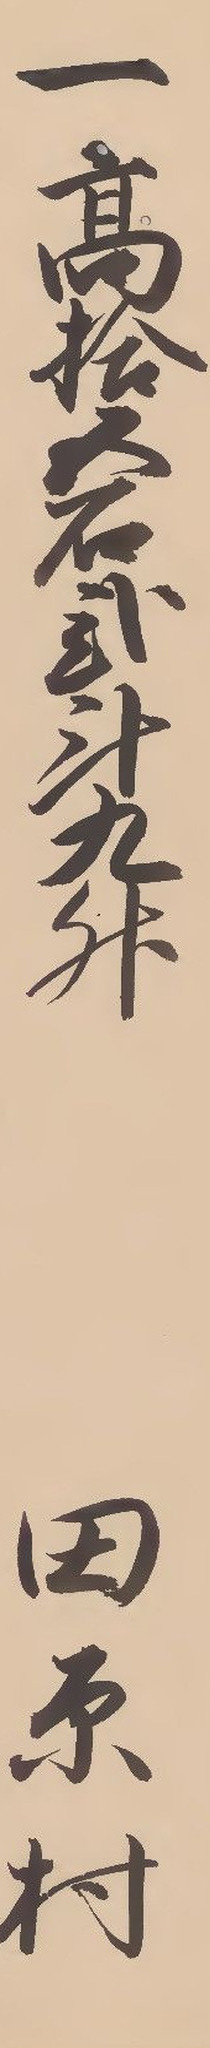一高拾五石弐斗九升田原村
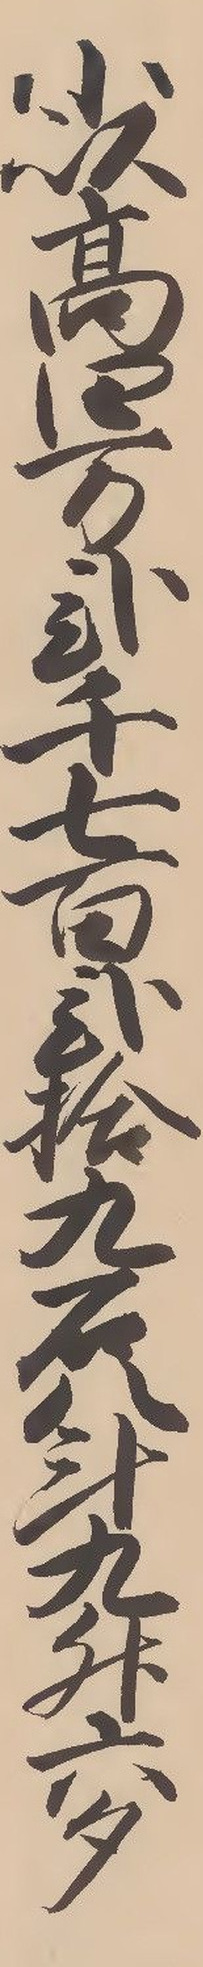小以高四万弐千七百弐拾九石八斗九升六勺

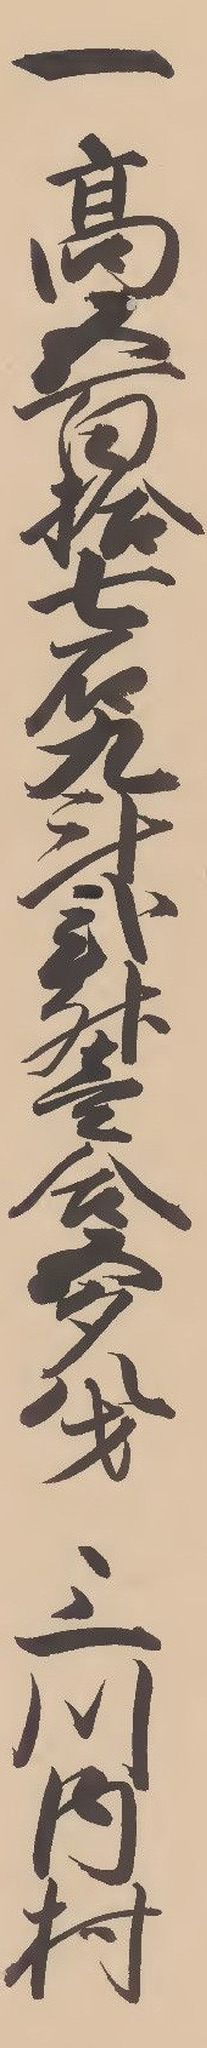一高五百拾七石九斗弐升壱合五勺八才三川内村
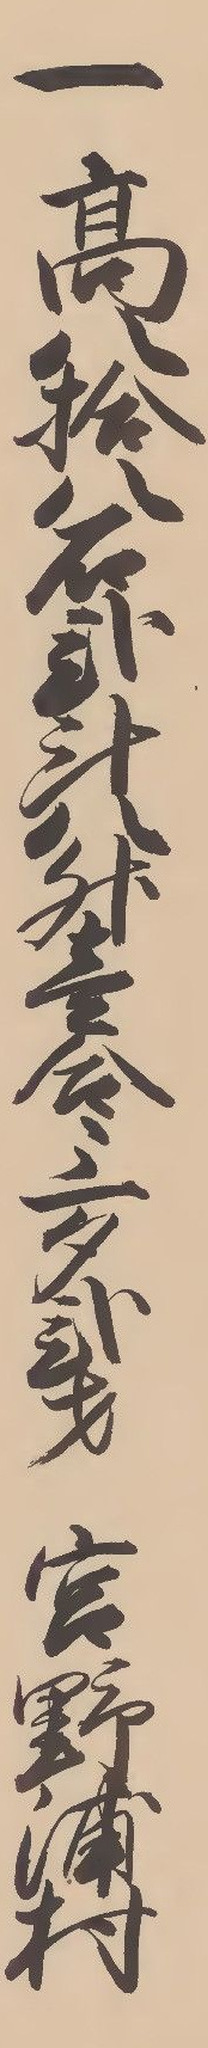一高八拾八石弐斗八升壱合三勺弐才宮野浦村
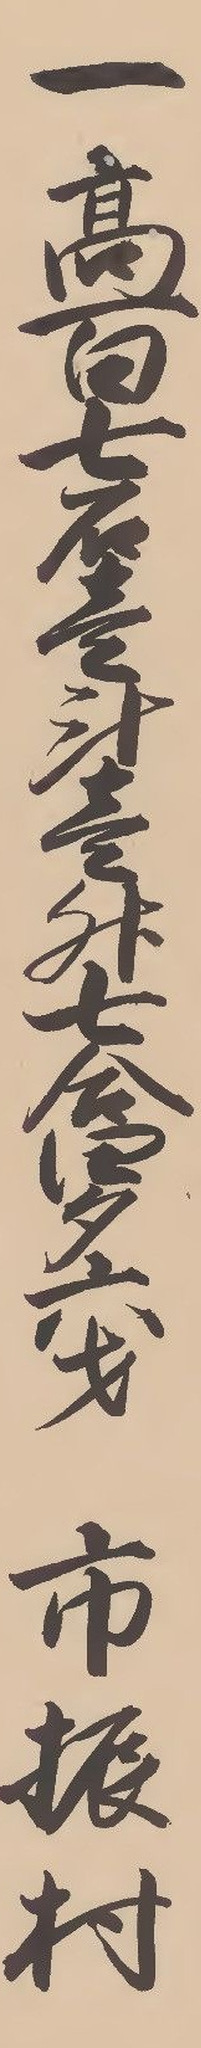一高百七石壱斗壱升七合四勺六才市振村
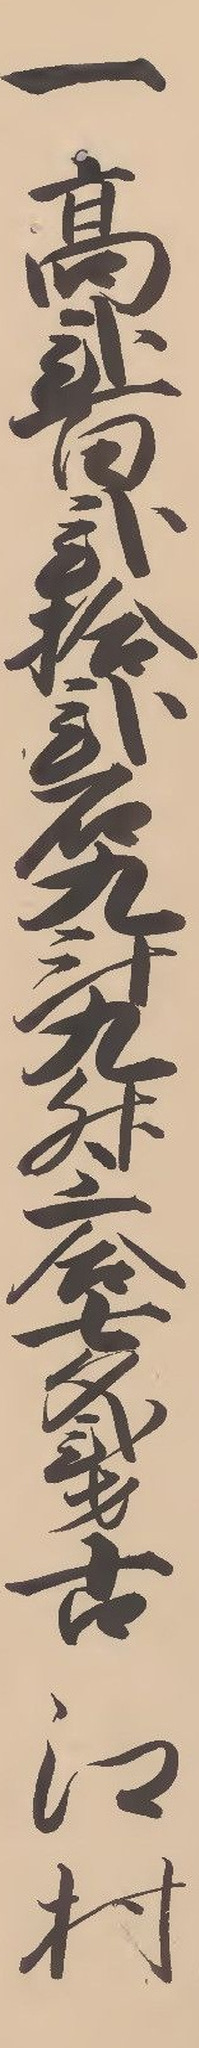一高弐百弐拾弐石九斗九升三合七勺弐才古江村
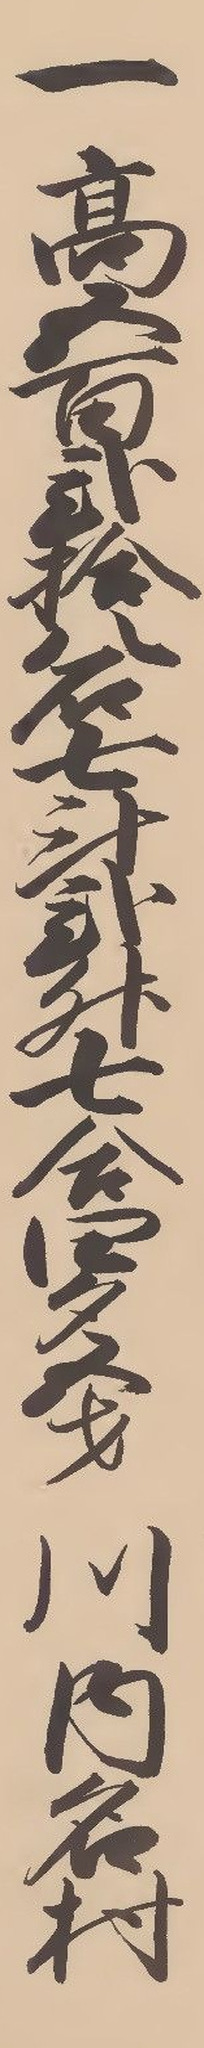一高五百弐拾八石七斗弐升七合四勺五才川内名村
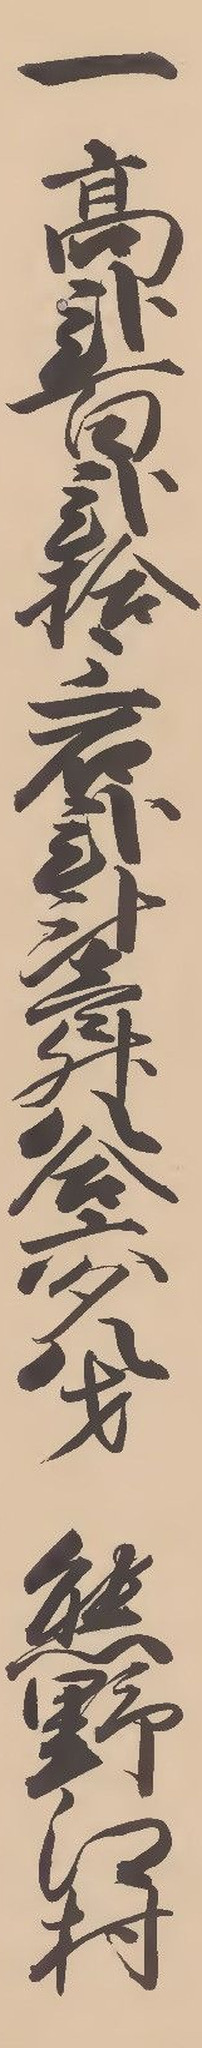一高弐百弐拾三石弐斗壱升八合六勺八才熊野江村
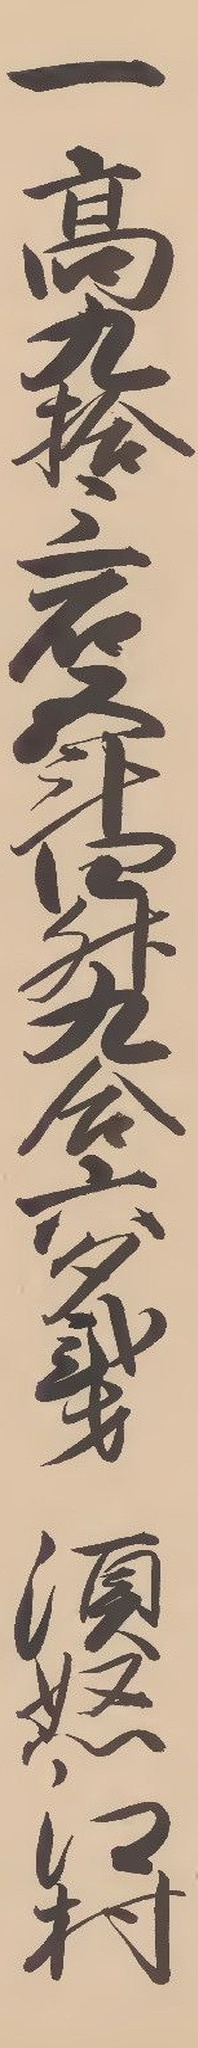一高九拾三石五斗四升九合六勺弐才須怒江村

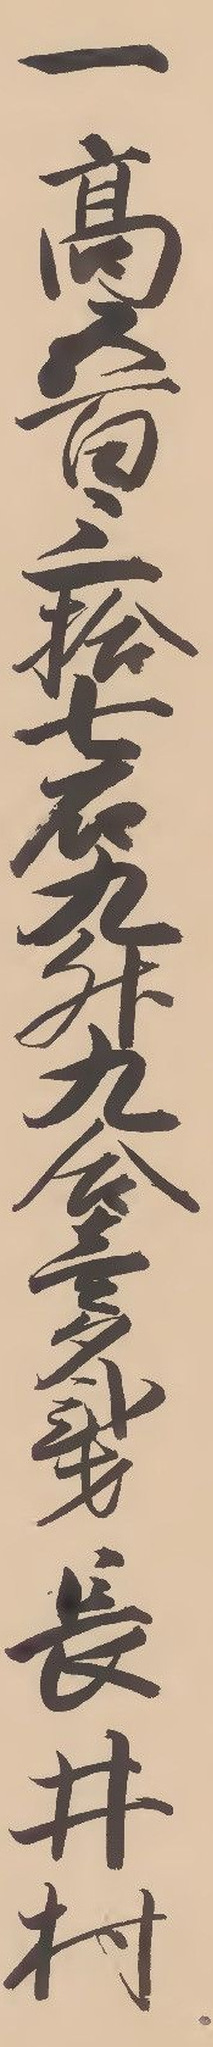一高五百三拾七石九升九合壱勺弐才長井村
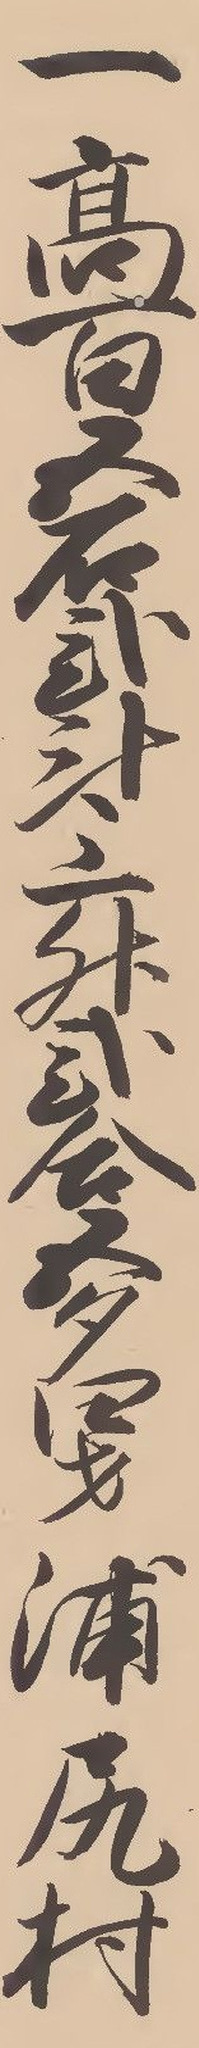一高百五石弐斗三升弐合五勺四才浦尻村
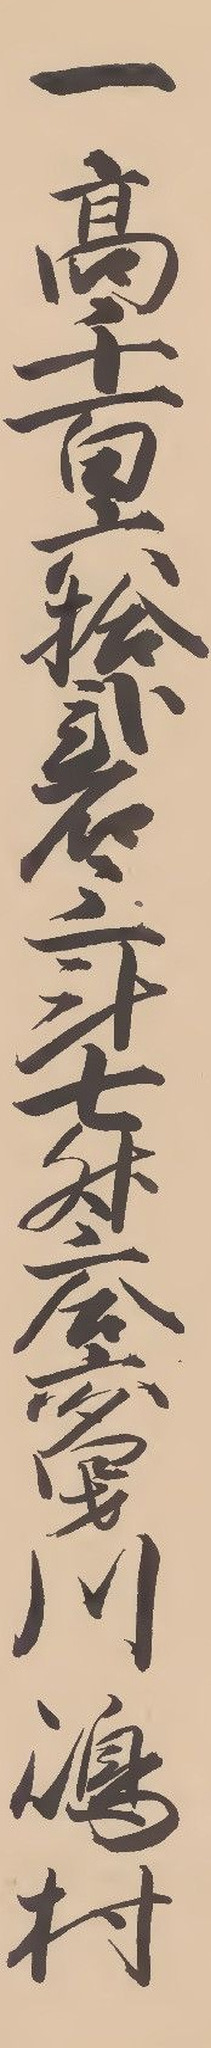一高千百六拾弐石三斗七升三合六勺四才川島村
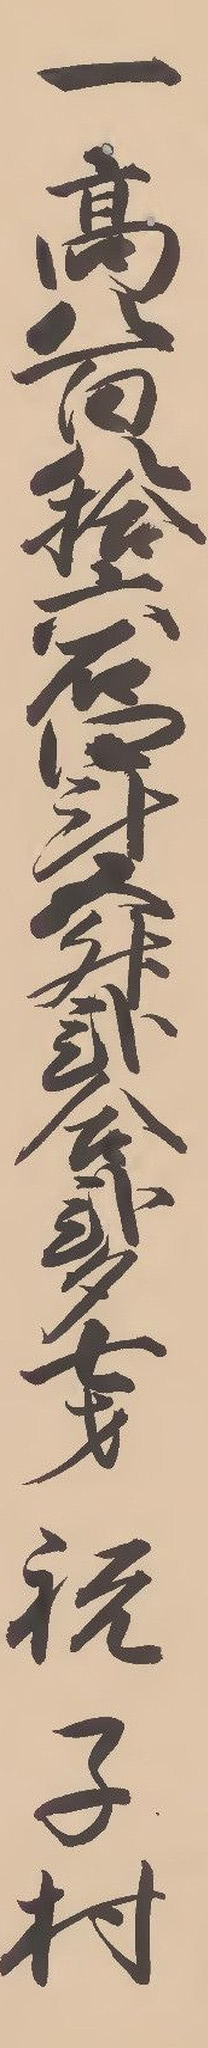一高八百八拾六石四斗五升弐合弐勺七才祝子村
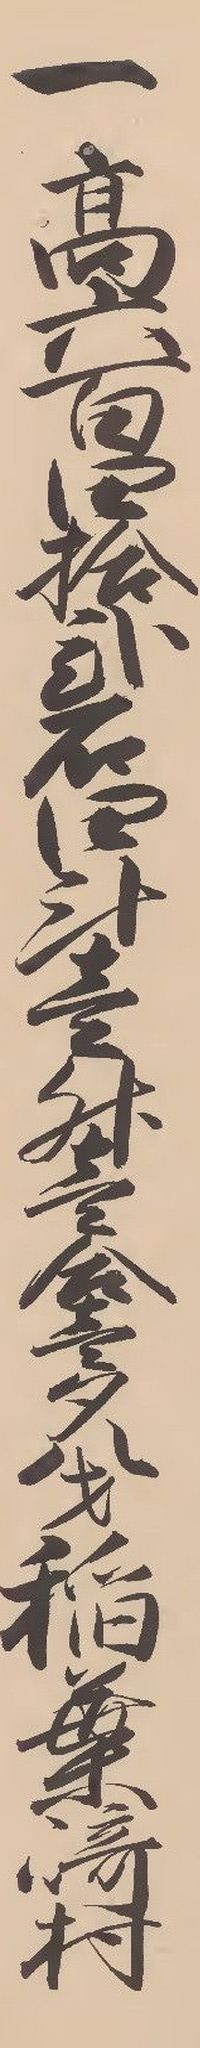一高六百四拾弐石四斗壱升壱合壱勺八才稲葉崎村
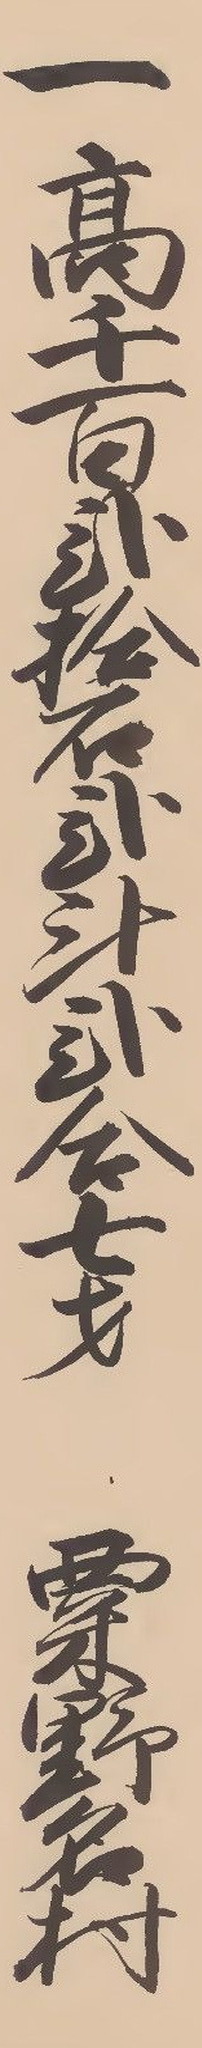一高千百弐拾石弐斗弐合七才粟野名村
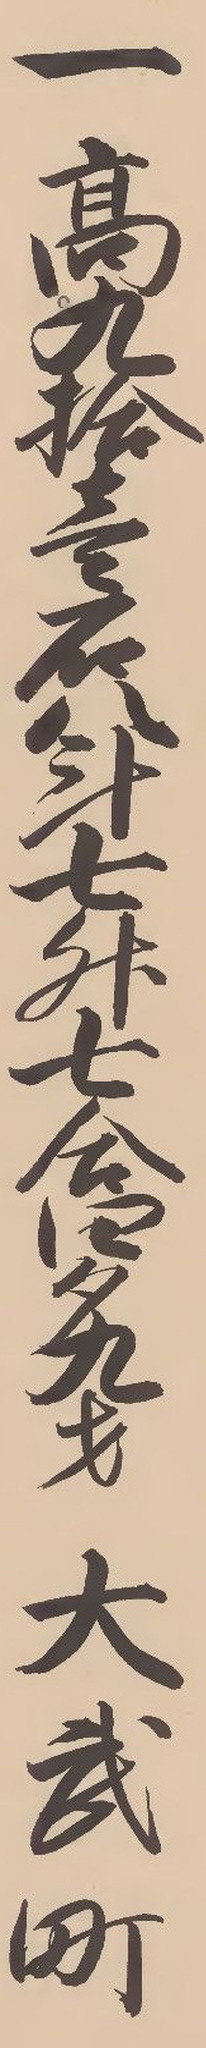一高九拾壱石八斗七升七合四勺九才大武町
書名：日向国郷帳
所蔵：国立公文書館 National Archives of Japan
